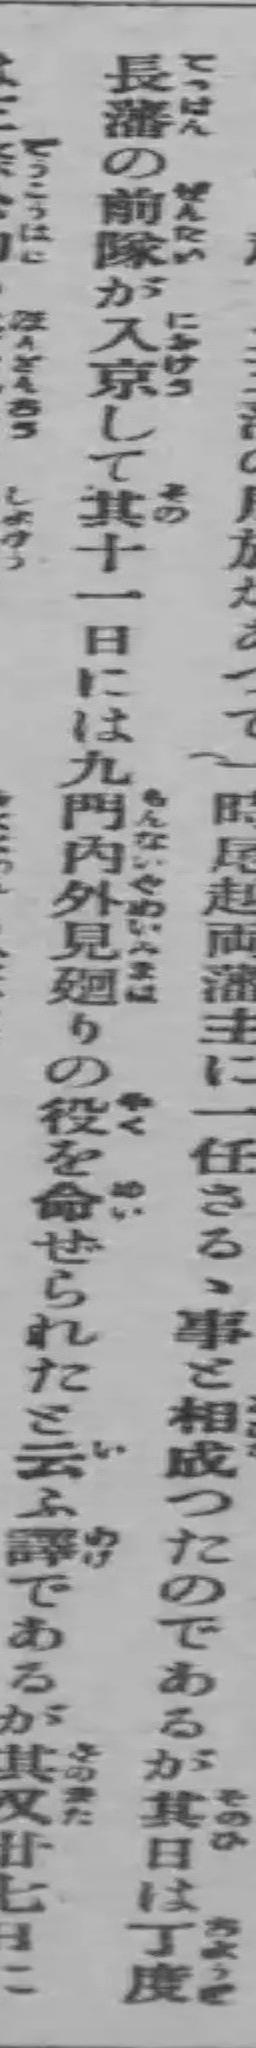長藩の前隊が入京して其十一日には九門内外見廻りの役を命ぜられたと云ふ訳であるが其又廿七日に
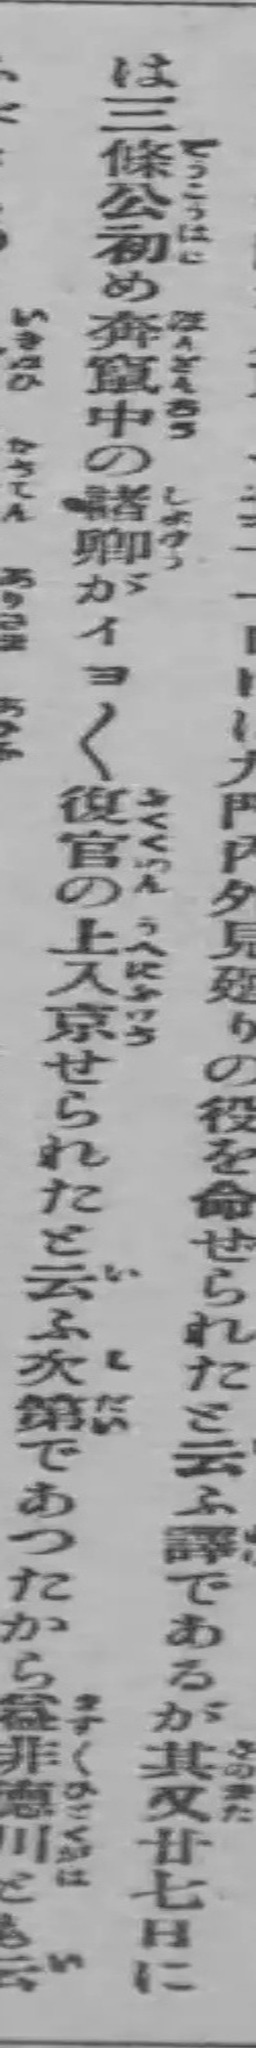は三條公初め奔竄中の諸卿がイヨ〳〵復官の上入京せられたと云ふ次第であつたから益非徳川とも云
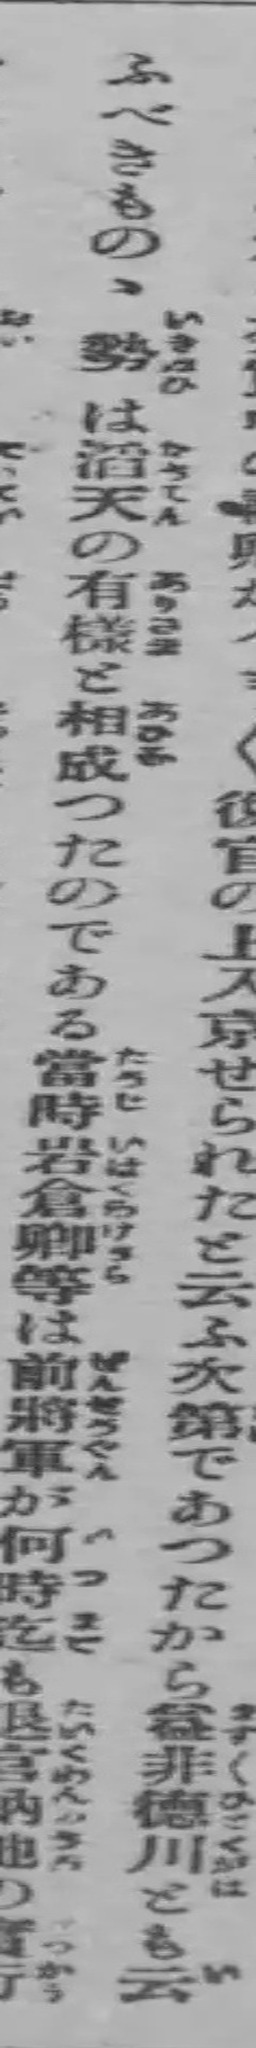ふべきものゝ勢は滔天の有様と相成つたのである当時岩倉卿等は前将軍が何時迄も退官納地の実行
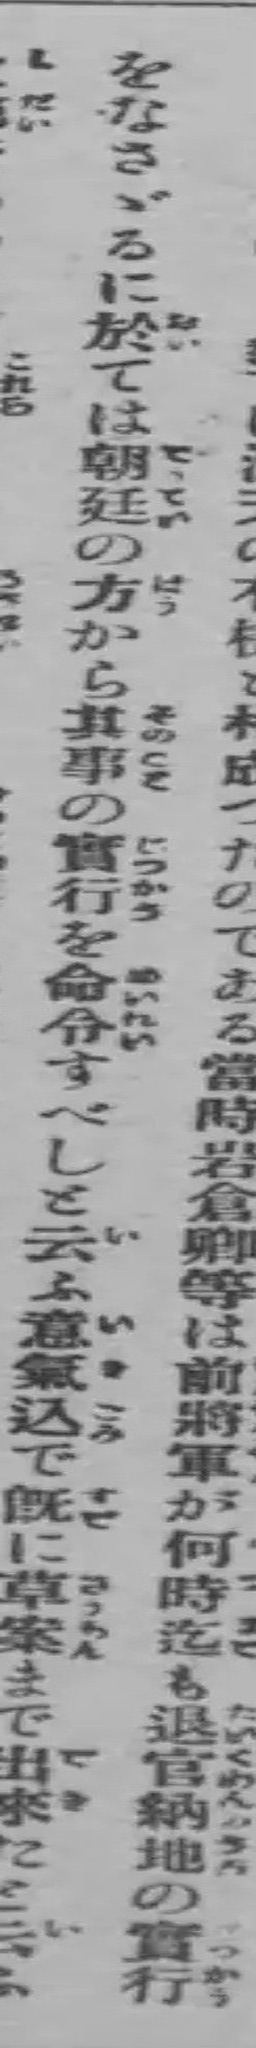をなさゞるては朝廷の方から其事の実行を命令すべしと云ふ意気込で既に草案まで出来たと云ふ
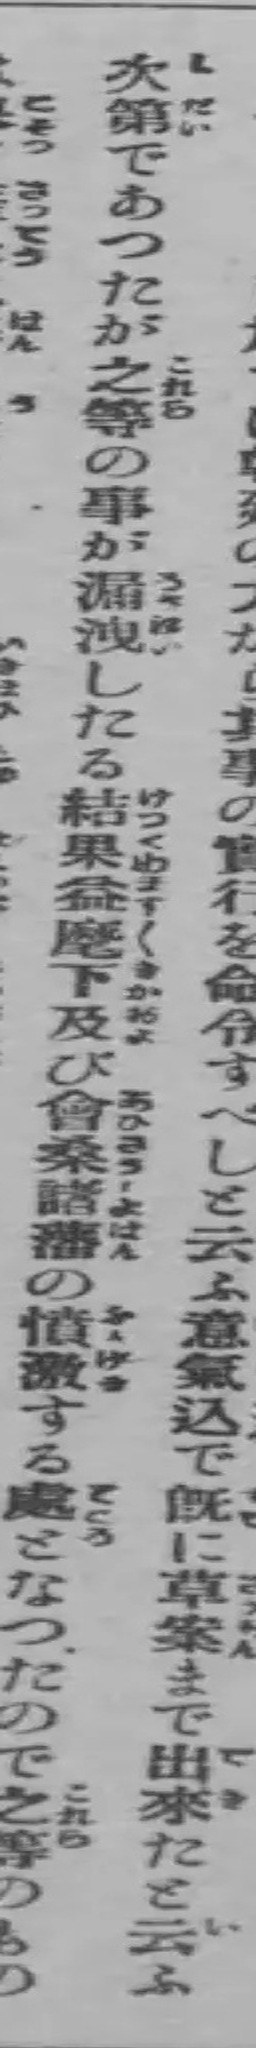次第であつたが之等の事が漏洩したる結果益麾下及び会桑緒藩の憤激する処となつたので之等のもの
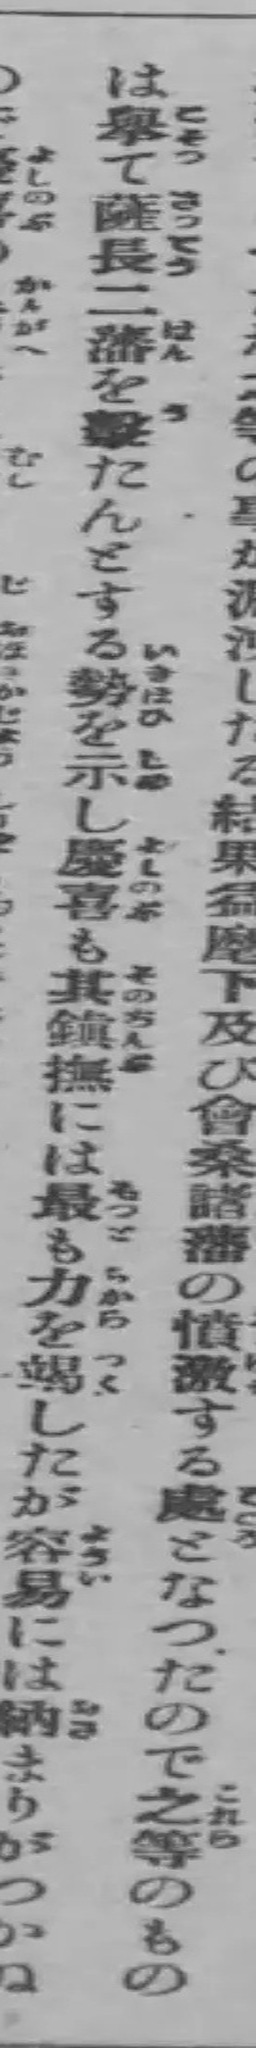は挙て薩長二藩を撃たんとする勢を示し慶喜も其鎮撫には最も力を竭したが容易には納まりがつかぬ
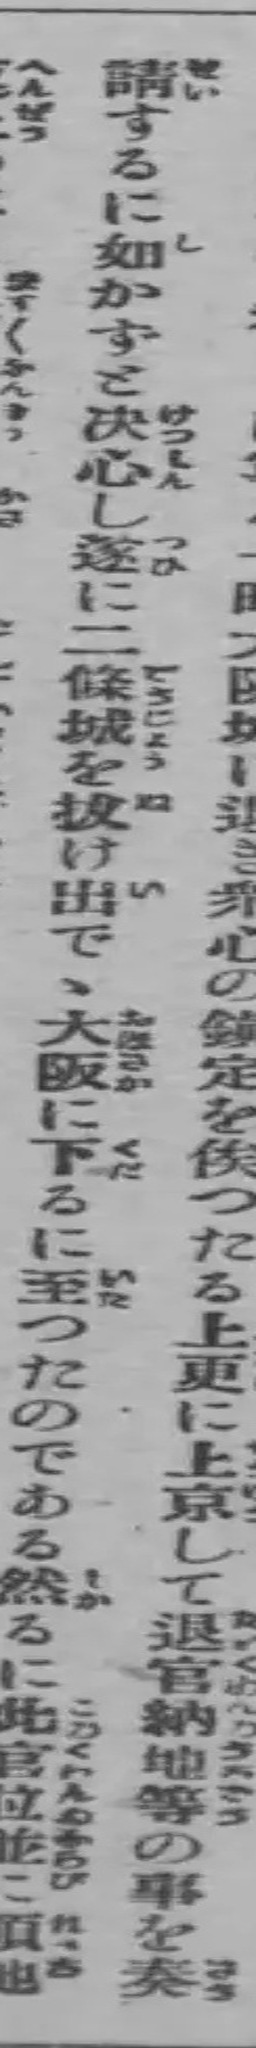請するに如かずと決心し遂に二条城を抜け出でゝ大阪に下るに至つたのである然るに此官位並に領地
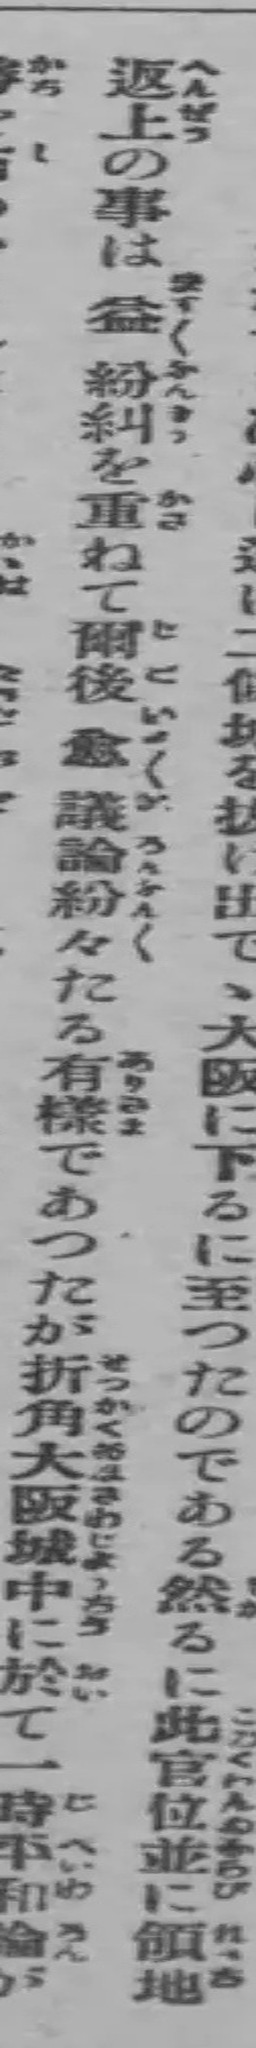返上の事は益紛糾を重ねて爾後愈議論紛々たる有様であつたが折角大阪城中に於て一時平和論が
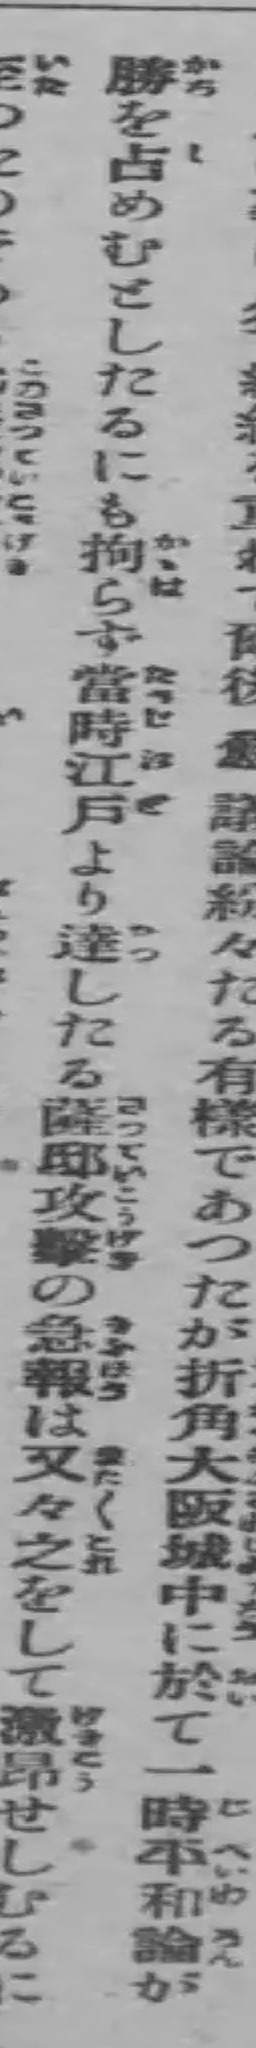勝を占めむとしたるにも拘らず当時江戸より達したる薩邸攻撃の急報は又々之をして激昂せしむるに
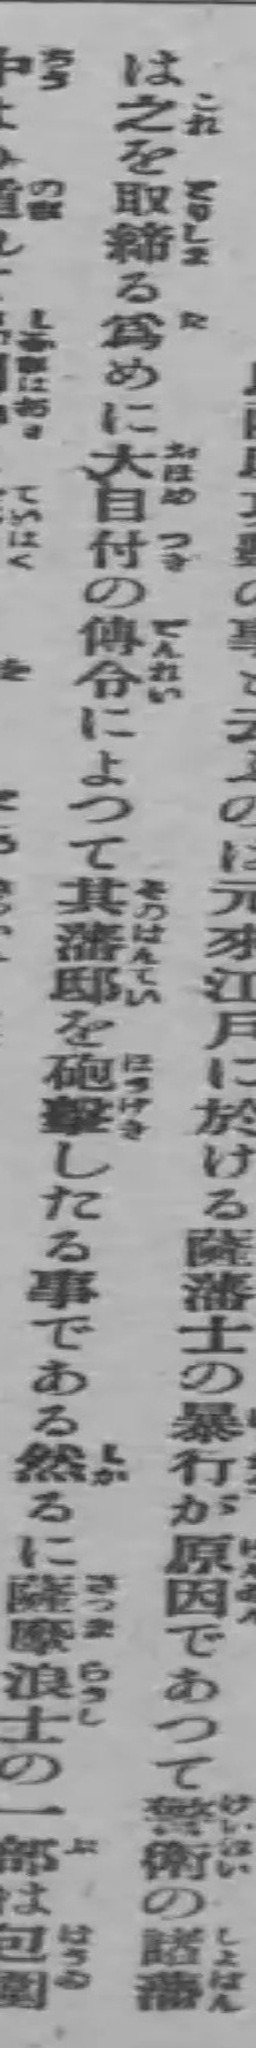は之を取締る為めに大目付の伝令によつて其藩邸を砲撃したる事である然るに薩摩浪士の一部は包囲
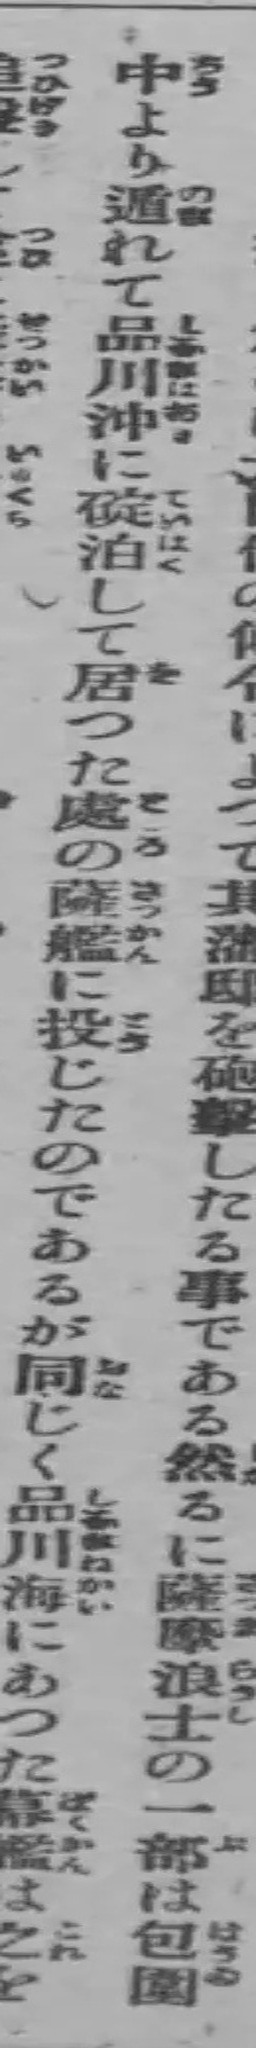中より遁れて品川沖に碇泊して居つた処の薩艦に投じたのであるが同じく品川海にあつた幕艦は之を
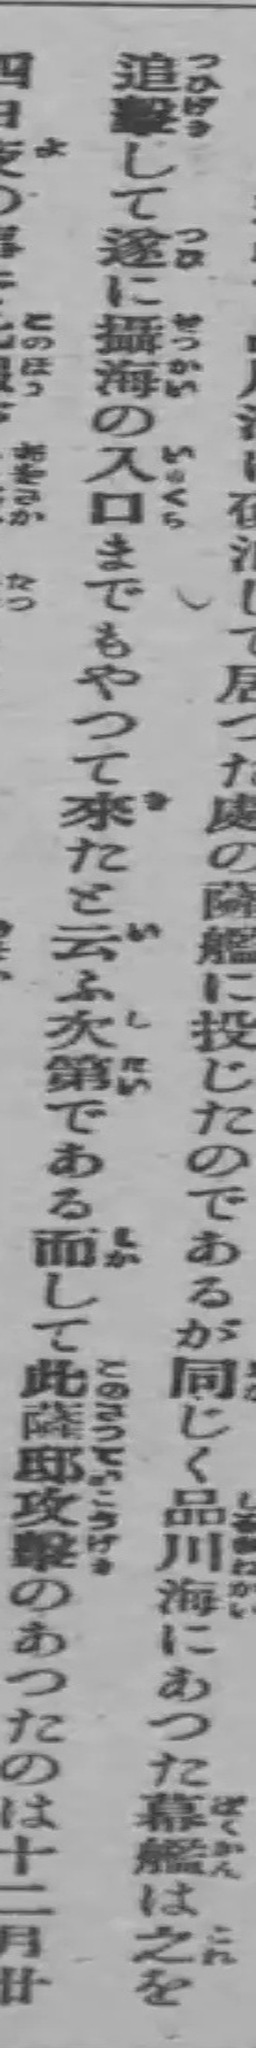追撃して遂に摂海の入口までもやつて来たと云ふ次第である而して此薩邸攻撃のあつたのは十二月廿
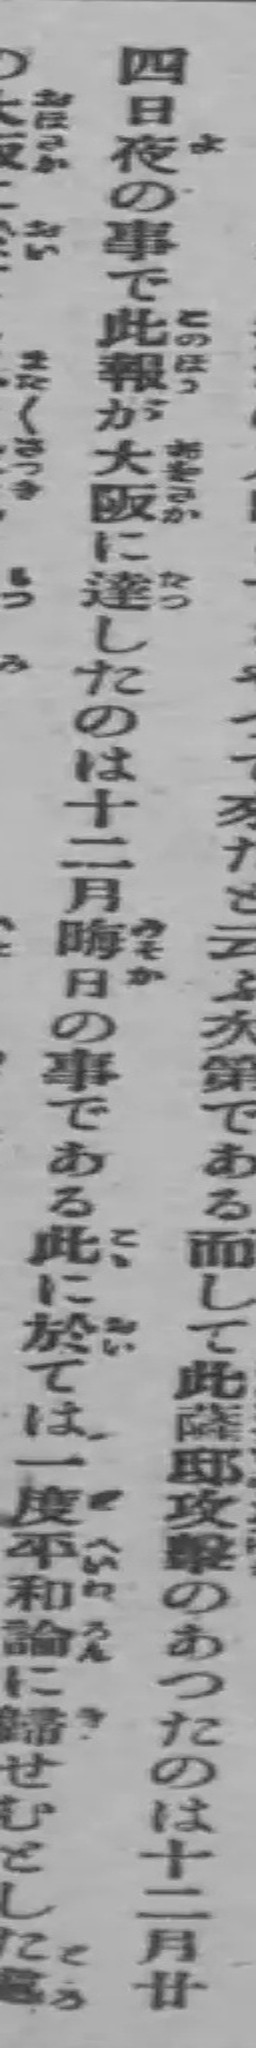四日夜の事で此報が大阪に達したのは十二月晦日の事である此に於ては一度平和論に帰せむとした処
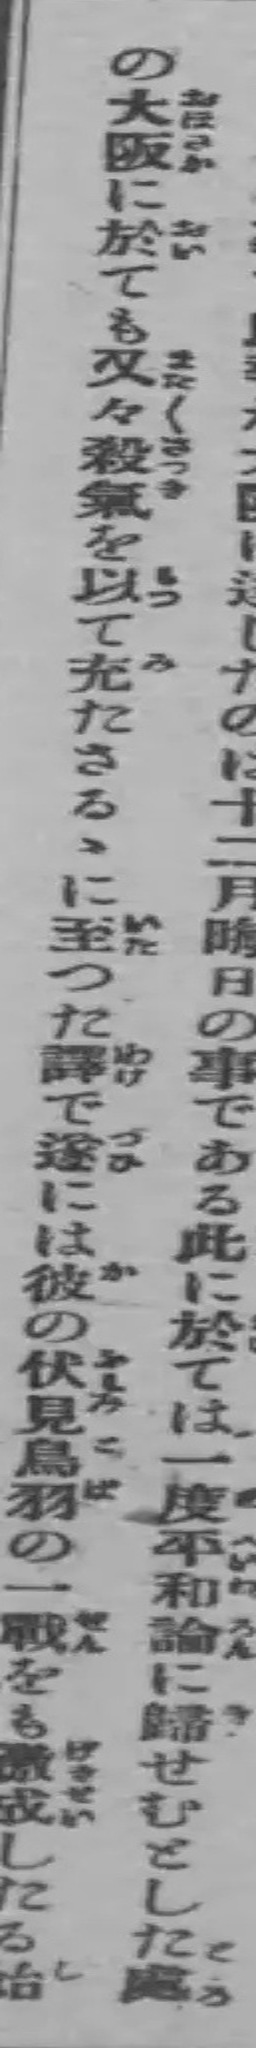の大阪に於ても又々殺気を以て充たさるゝに至つた訳で遂には彼の伏見鳥羽の一戦をも激成したる始
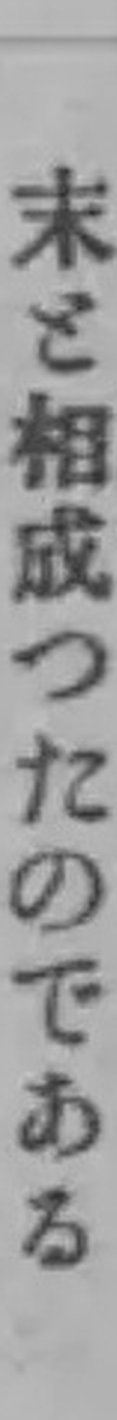末と相成つたのである
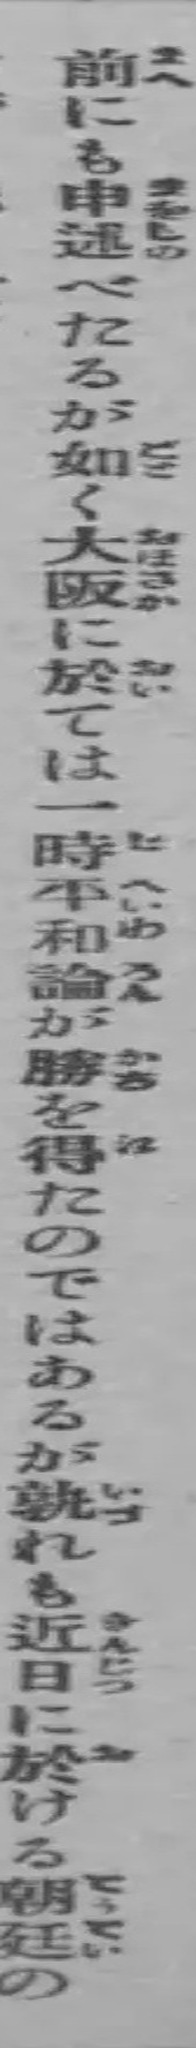前にも申述べたるが如く大阪に於ては一時平和論が勝を得たのではあるが孰れも近日に於ける朝廷の
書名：豊橋市史談
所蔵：国立国会図書館 National Diet Library, JAPAN
